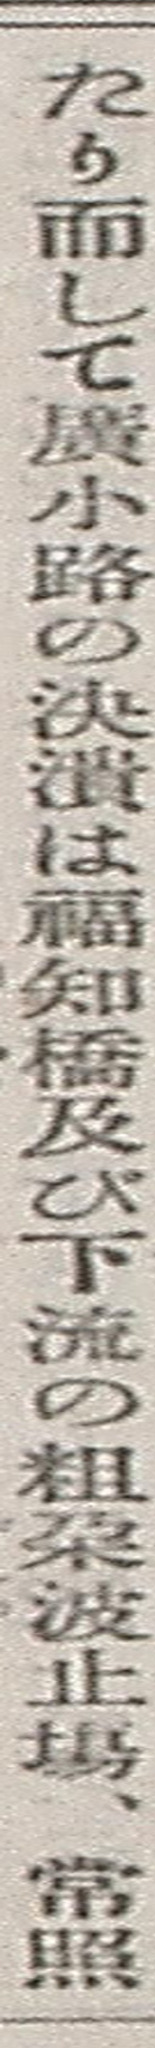たり而して広小路の决潰は福知橋及び下流の粗朶波止場、常照
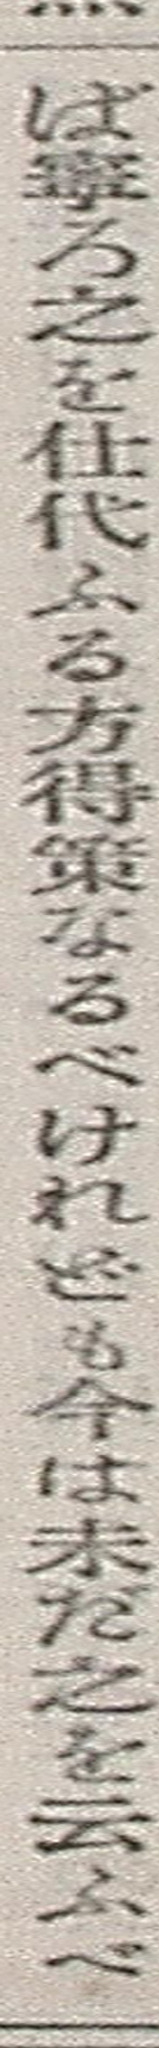ば寧ろ之を仕代なる方得策なるべけれども今は未だ之を云ふべ
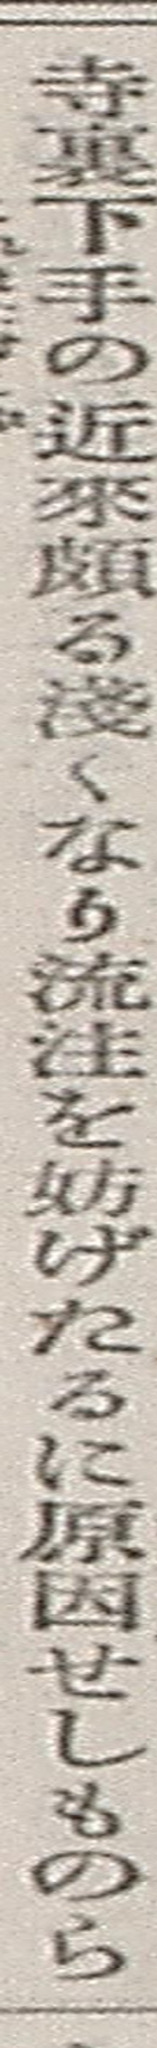寺裏下手の近来頗る浅くなり流注を妨げたるに原因せしものら
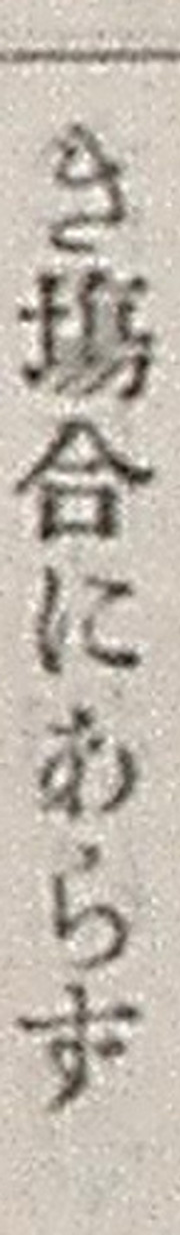き場合にあらず
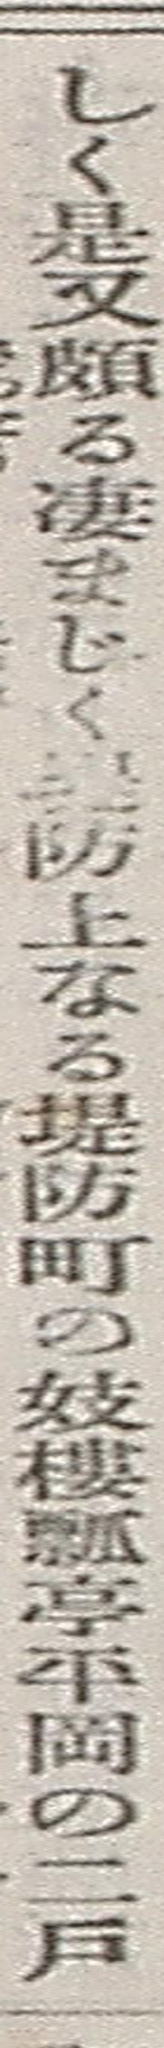しく是又頗る凄まじく堤防上なる堤防町の妓楼瓢亭平岡の二戸
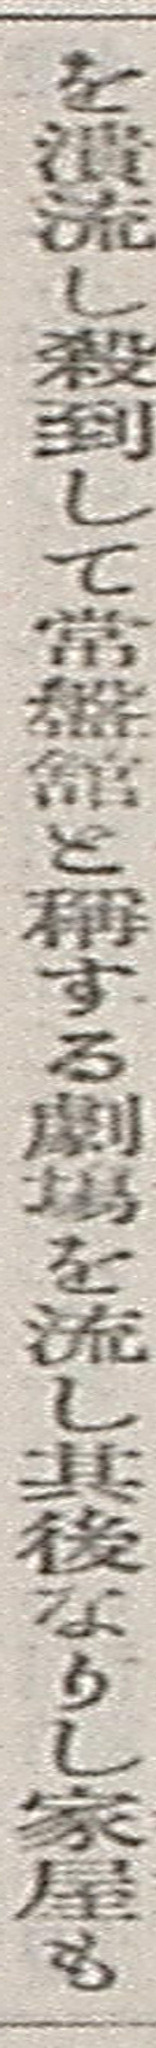を潰流し殺到して常盤館と称する劇場を流し其後なりし家屋も
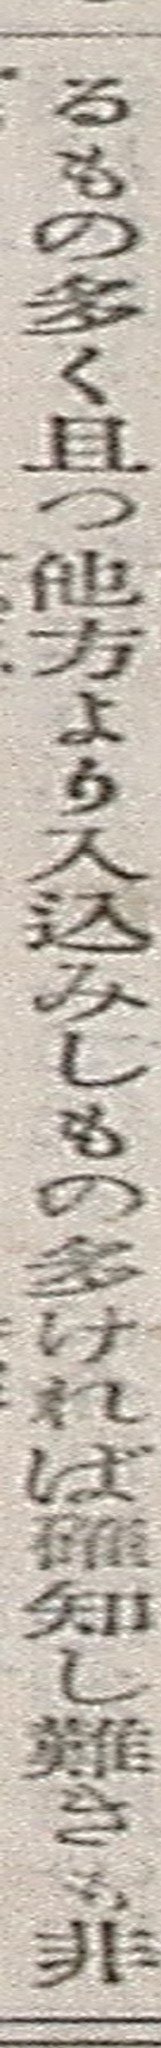るもの多く且つ他方より入込みしもの多ければ確知し難きも非
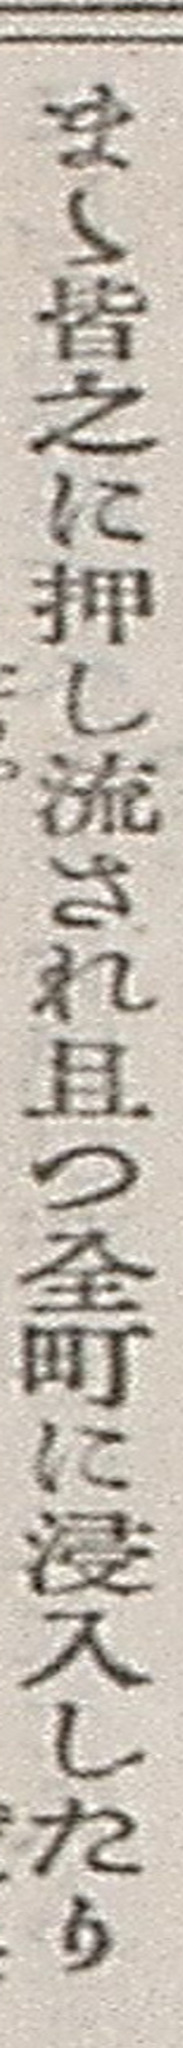また皆之に押し流され且つ全町に侵入したり
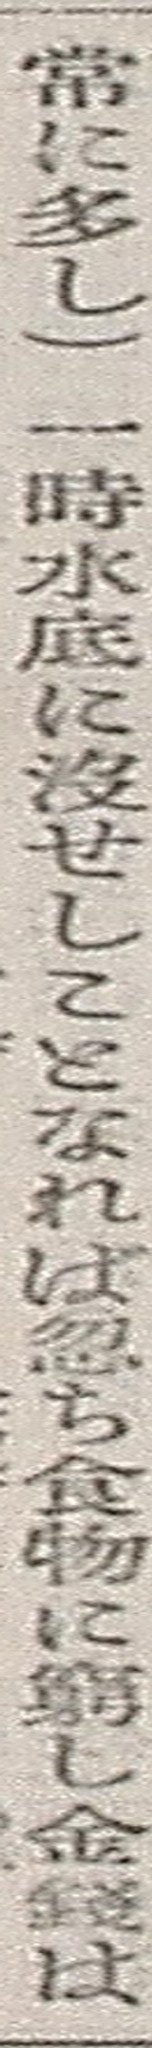常に多し）一時水底に没せしことなれば忽ち食物に窮し金銭は
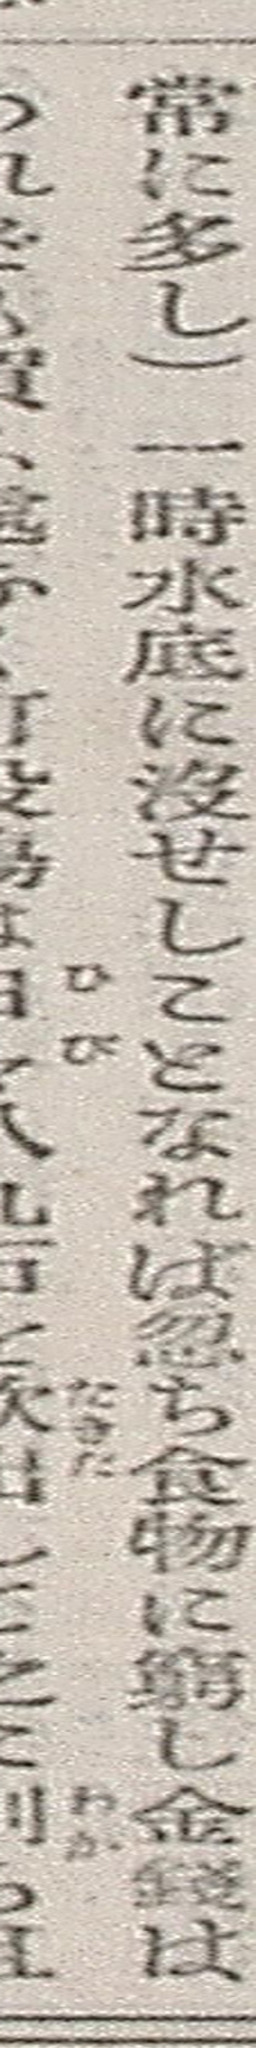あれども買ふ処なく町役場は日々八九石を炊出して之に別ち且
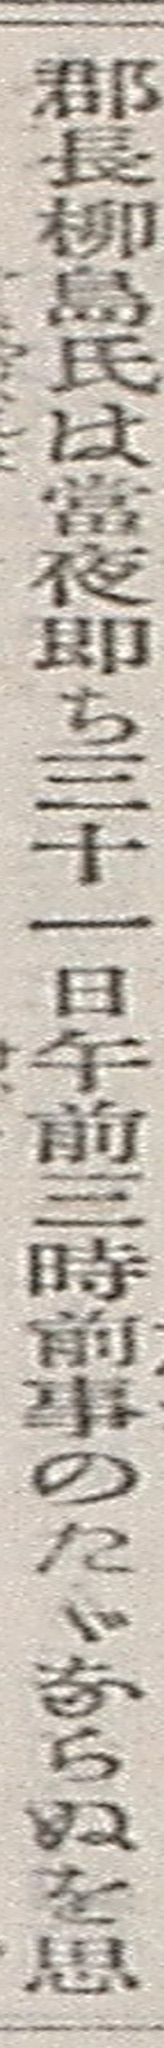郡町柳嶋氏は当夜即ち三十一日午前三時前事のたゞならぬを思
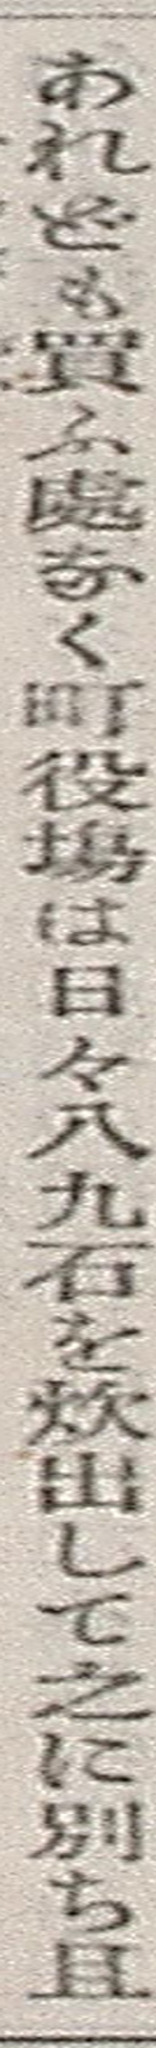あれども買ふ処なく町役場は日々八九石を炊出して之に別ち且
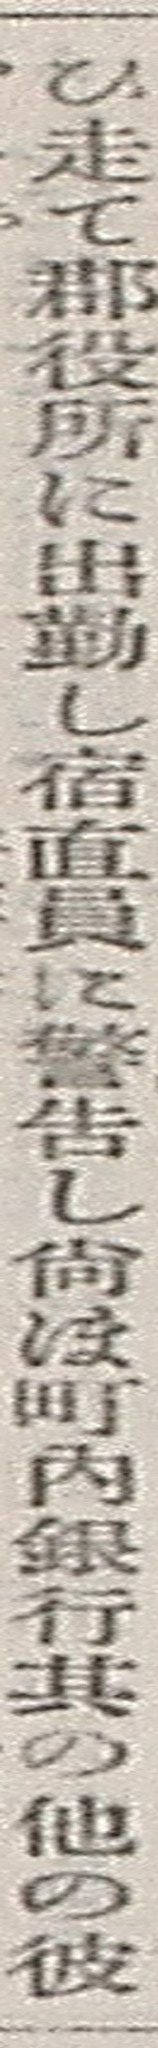ひ走て郡役所に出勤し宿直員に警告し尚ほ町内銀行其の他の彼
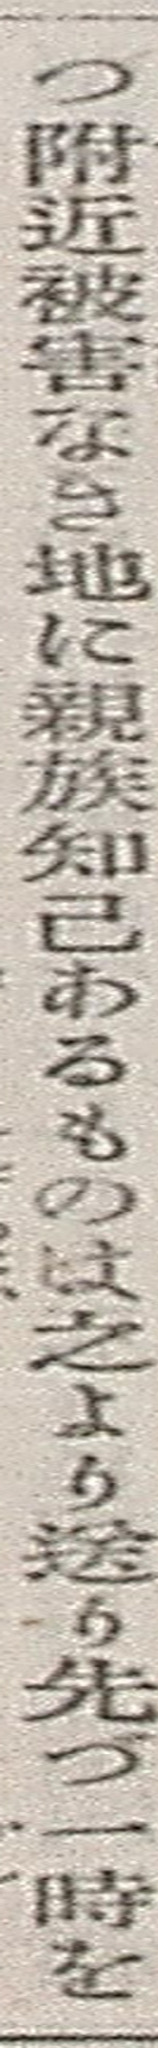つ附近被害なき地に親族知己あるものは之より送り先づ一時を
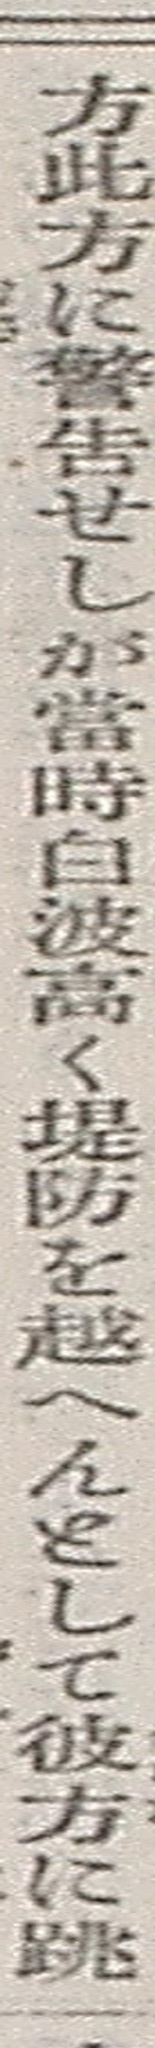方此方に警告せしが当時白波高く堤防を越へんとして彼方に跳
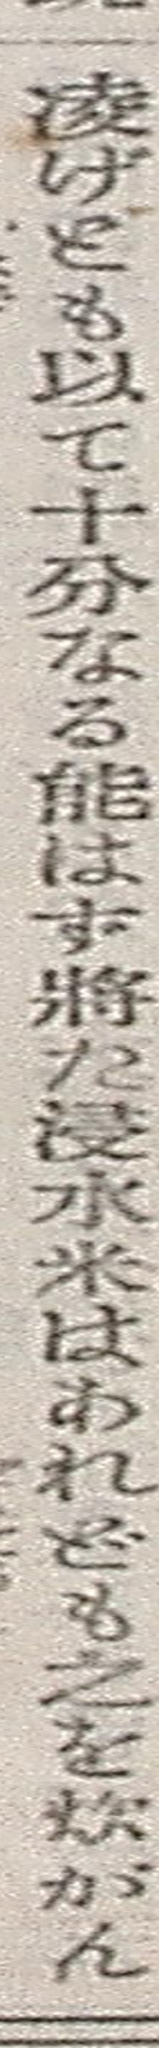凌げども以て十分なる能はず将た浸水米はあれども之を炊がん
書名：風俗畫報臨時増刊第百二十六號　洪水被害録（中）
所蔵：東京大学地震研究所図書室 Earthquake Research Institute Library, The University of Tokyo, JAPAN
